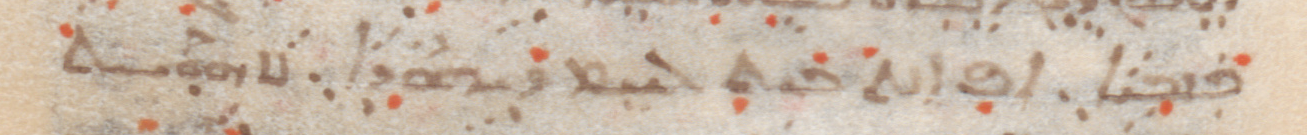ܒ݁ܢܒ݂ܝܐ܉ ܐܦ ܐܢܬܝ ܒܝܬܠܚܡ ܕܝܗܘܕܐ܆ ܠܐ ܗܘܝܬ
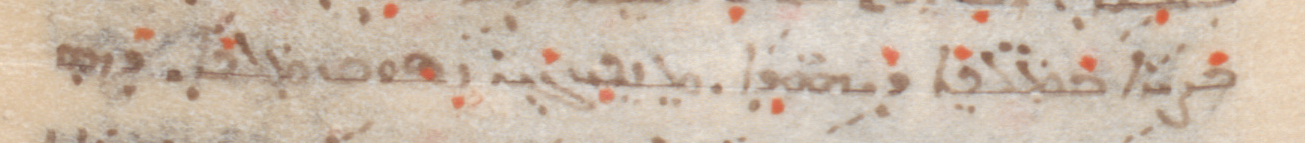ܒܨܝܪܐ ܒܡܠܟܐ ܕܝܗܘܕܐ ܡܢܟܝ ܓܝܪ ܢܦܘܩ ܡܠܟܐ. ܕܗ̣ܘ
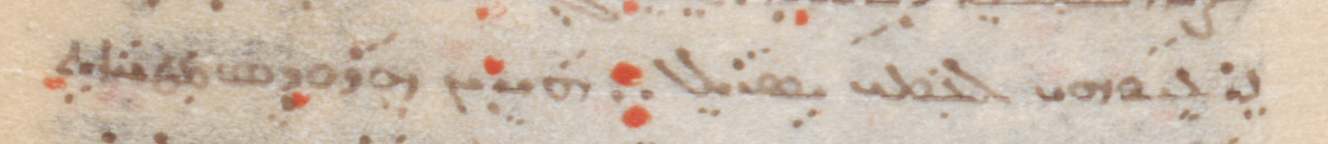ܢܪܥܝܘܗܝ ܠܥܡܝ ܝܣܪܐܝܠ܀ ܗܝܕܝܢ ܗܪܘܕܣ ܡܛܫܝܐܝܬ
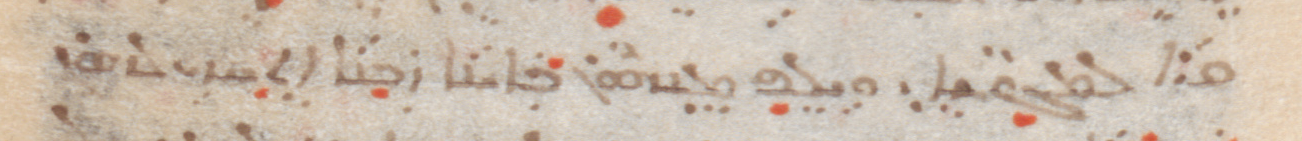ܩܪܐ ܠܡܓܘ̈ܫܐ܆ ܘܝܠܦ ܡܢܗܘܢ ܒܐܝܢܐ ܙܒܢܐ ܐܬܚܙܝ ܠܗܘܢ
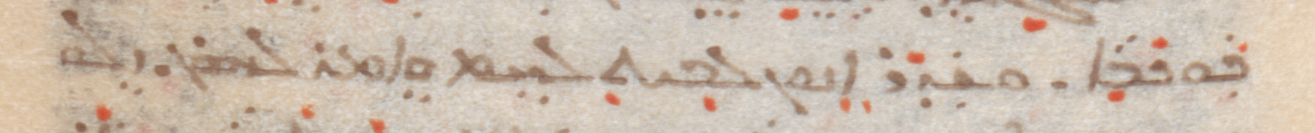ܟܘܟܒܐ. ܘܫܕܪ ܐܢܘܢ ܠܒܝܬܠܚܡ ܘܐܡ̣ܪ ܠܗܘܢ. ܙܠܘ
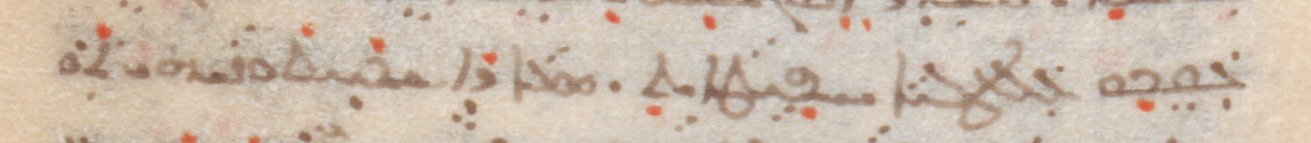ܥܩܒܘ ܥܠ ܛܠܝܐ ܚܦܝܛܐܝܬ. ܘܡܐ ܕܐܫܟܚܬܘܢܝܗܝ ܬܘ
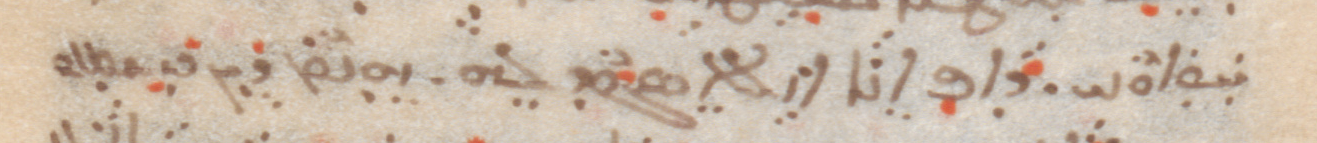ܚܘܐܘܢܝ. ܕܐܦ ܐܢܐ ܐܙܠ ܐܣܓܘܕ ܠܗܘ ܗܢܘܢ ܕܝܢ ܟܕ ܫܡ̣ܥ
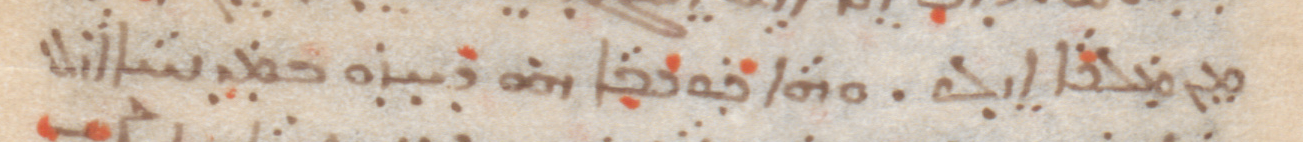ܡ̣ܢ ܡܠܟܐ ܐܙܠ̣ܘ. ܘܗܐ ܟܘܟܒܐ ܗ̇ܘ ܕܚܙܘ ܒܡܕܢܚܐ ܐܙ̇ܠ
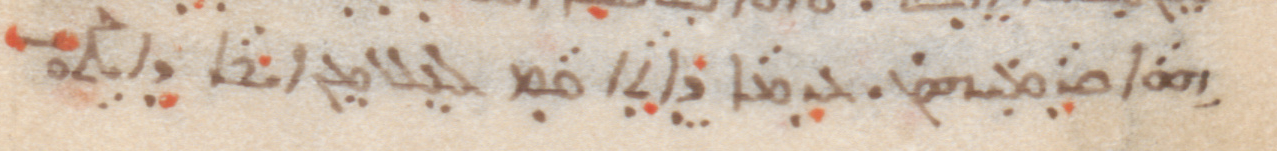ܗܘܐ ܩܕܡܝܗܘܢ. ܥܕܡܐ ܕܐܬܐ ܩ̣ܡ ܠܥܠ ܡ̣ܢ ܐܝܟܐ ܕܐܝܬ܏ܘ
